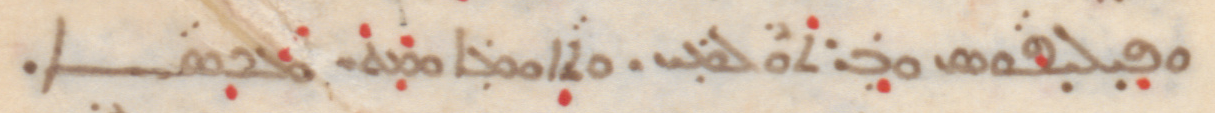ܘܦܝܠܝܦܘܣ ܘܒܪܬܘܠܡܝ. ܘܬܐܘܡܐ ܘܡܬܝ ܡܟܣܐ.
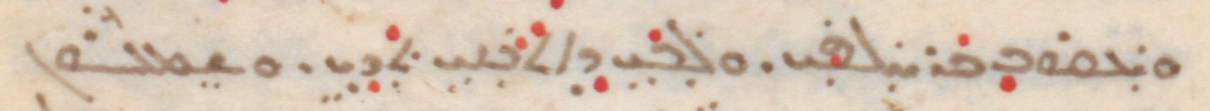ܘܝܥܩܘܒ ܒܪ ܚܠܦܝ. ܘܠܒܝ ܕܐܬܟܢܝ ܬܕܝ. ܘܫܡܥܘܢ
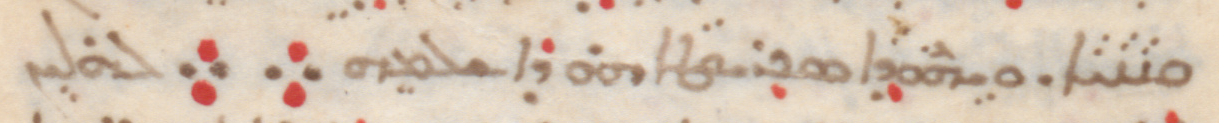ܩܢܢܝܐ. ܘܝܗܘܕܐ ܣܟܪܝܘܛܐ ܗ̇ܘ ܕܐܫܠܡܗ܀ ܀ ܠܗܠܝܢ
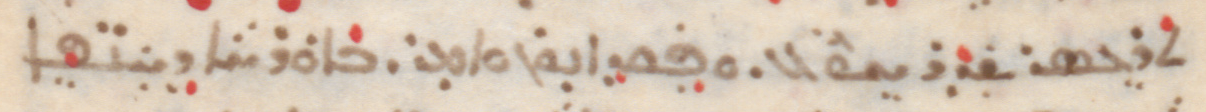ܬܪܥܣܪ ܫܕܪ ܝܫܘܥ. ܘܦܩܕ ܐܢܘܢ ܘܐܡ̣ܪ. ܒܐܘܪܚܐ ܕܚܢ̈ܦܐ
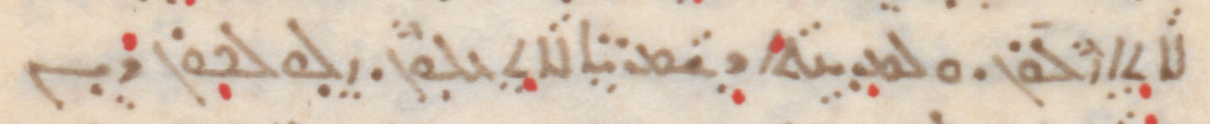ܠܐ ܬܐܙܠܘܢ. ܘܠܡܕܝܢܬܐ ܕܫܡܪ̈ܝܐ ܠܐ ܬܥܠܘܢ. ܙܠ̣ܘ ܠܟܘܢ ܕܝܢ
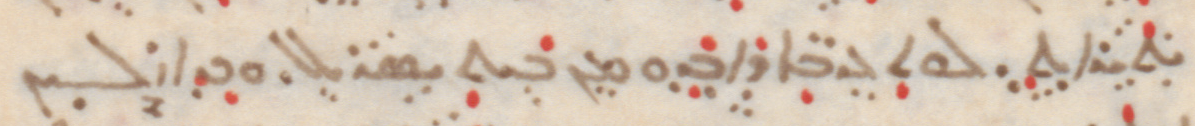ܝܬܝܪܐܬ ܠܘܬ ܥܪ̈ܒܐ ܕܐܒܕܘ ܡ̣ܢ ܒܝܬ ܝܣܪܝܠ. ܘܟܕ ܐܙܠ̣ܝܢ
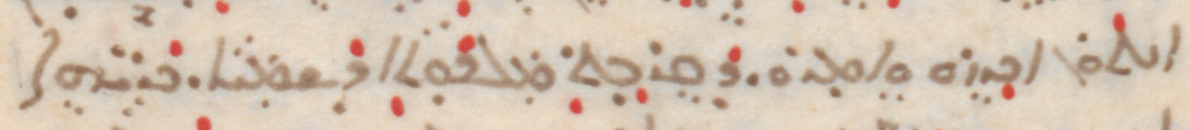ܐܢܬܘܢ ܐܟܪܙܘ ܘܐܡ̣ܪܘ. ܕܩܪܒܬ݀ ܡܠܟܘܬܐ ܕܫܡܝܐ. ܟܪ̈ܝܗܐ
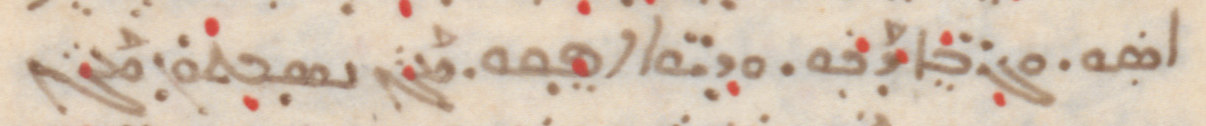ܐܣܘ. ܘܓܪ̈ܒܐ ܕܟܘ. ܘܕܝ̈ܘܐ ܐܦ̣ܩܘ. ܡܓܢ ܢܣ̣ܒܬܘܢ ܡܓܢ
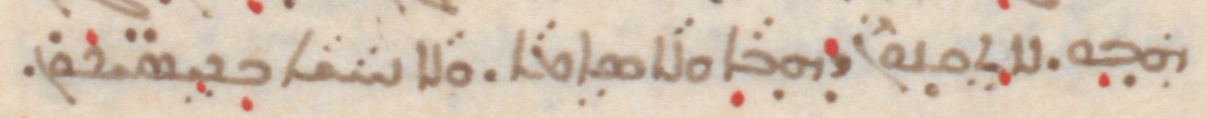ܗܒ̣ܘ. ܠܐ ܬܩܢܘܢܢ ܕܗܒܐ ܘܠܐ ܣܐܡܐ. ܘܠܐ ܢܚܫܐ ܒܟܝܣ̈ܝܟܘܢ.
